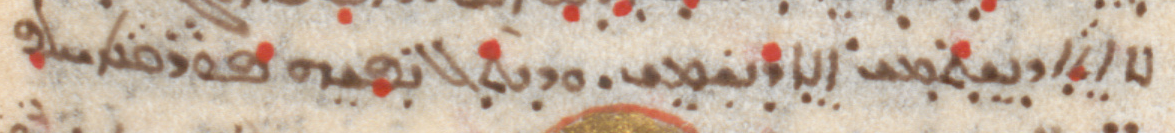ܠܐ ܐܬ̣ܐ ܕܢܫܬܡܫ ܐܠܐ ܕܢܫܡܫ. ܘܕܢܬܠ ܢܦܫܗ ܦܘܪܩܢܐ ܚܠܦ
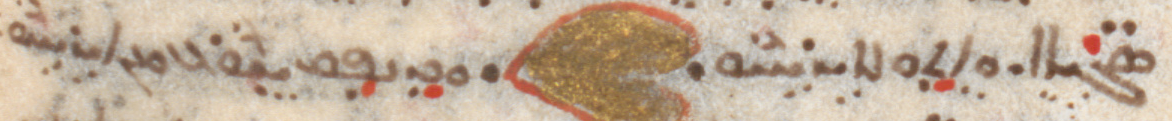ܣ̈ܓܐܐ. ܘܐܬ̣ܘ ܠܐܝܪܝܚܘ. ܀ ܘܟܕ ܢܦܩ ܝܫܘܥ ܡܢ ܐܝܪܝܚܘ
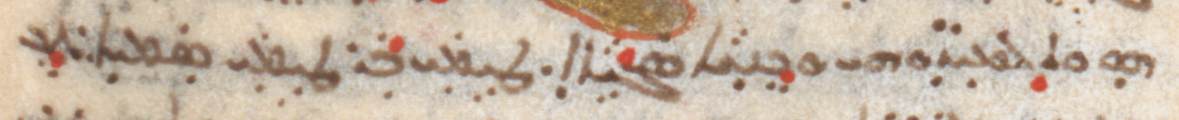ܗ̣ܘ ܘܬܠܡܝ̈ܕܘܗܝ ܘܟܢܫܐ ܣܓܝܐܐ܆ ܛܝܡܝ ܒܪ ܛܝܡܝ ܣܡܝܐ܆ ܝ̇ܬܒ
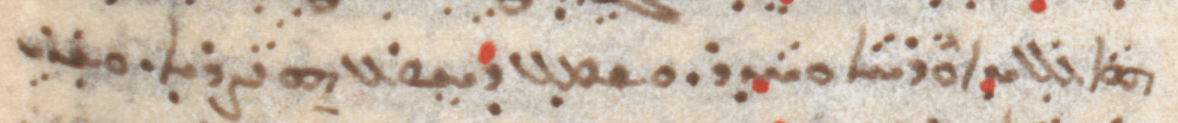ܗܘܐ ܥܠ ܝܕ ܐܘܪܚܐ ܘܚܕܪ. ܘܫܡ̣ܥ ܕܝܫܘܥ ܗܘ ܢܨܪܝܐ. ܘܫܪܝ
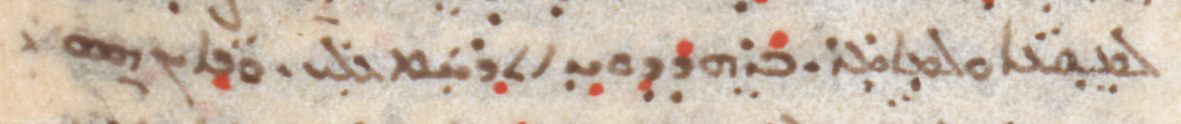ܠܡܩܥ̈ܐ ܘܠܡܐܡܪ. ܒܪܗ ܕܕܘܝܕ ܐܬܪܚܡ ܥܠܝ. ܘܟܐܝܢ ܗܘܘ
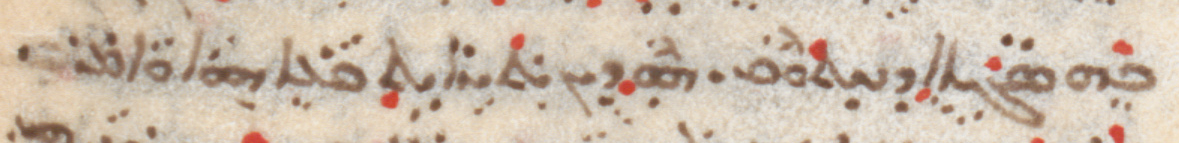ܒܗ ܣ̈ܓܝܐܐ ܕܢܫܬܘܩ. ܗ̣ܘ ܕܝܢ ܝܬܝܪܐܝܬ ܩ̇ܥܐ ܗܘܐ ܘܐܡ̇ܪ.
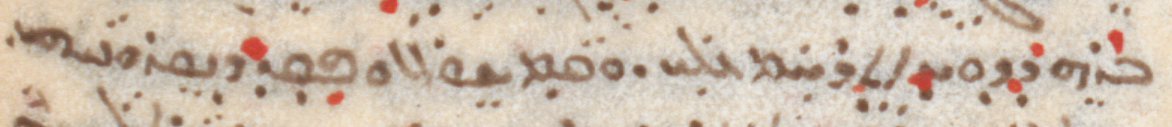ܒܪܗ ܕܕܘܝܕ ܐܬܪܚܡ ܥܠܝ. ܘܩ̣ܡ ܝܫܘܥ ܘܦܩ̣ܕ ܕܢܩܪܘܢܝܗܝ.
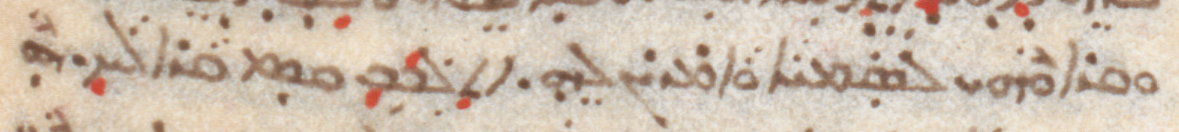ܘܩܪܐܘܗܝ ܠܣܡܝܐ ܘܐܡ̇ܪܝܢ ܠܗ. ܐܬܠܒܒ ܩܘܡ ܩܪܐ ܠܟ. ܗ̣ܘ
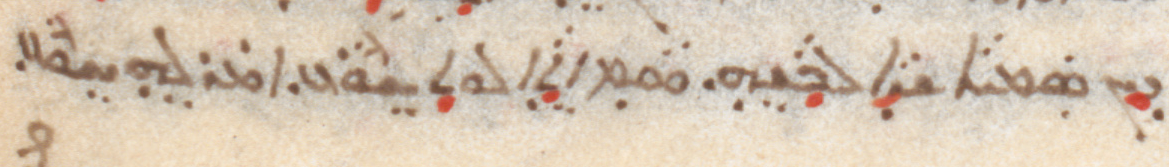ܕܝܢ ܣܡܝܐ ܫܕܐ ܠܒܫܗ. ܘܩ̣ܡ ܐܬܐ ܠܘܬ ܝܫܘܥ. ܐܡ̇ܪ ܠܗ ܝܫܘܥ
